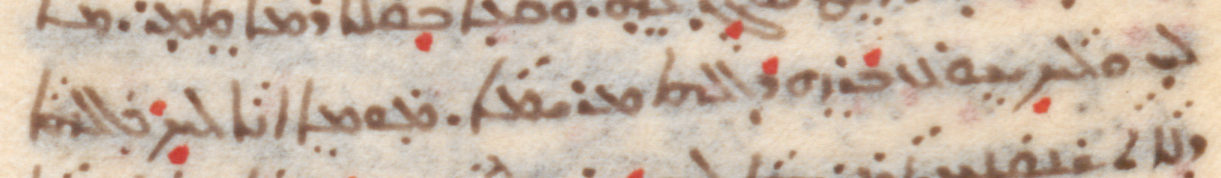ܘܠܝ ܘܠܟ ܝܫܘܥ ܒܪܗ ܕܐܠܗܐ ܡܪܝܡܐ. ܡܘܡܐ ܐܢܐ ܠܟ ܒܐܠܗܐ
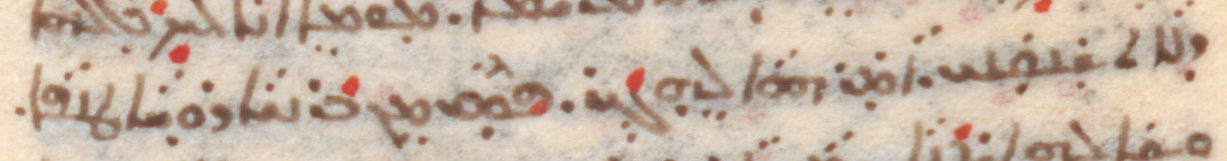ܕܠܐ ܫܢܩܢܝ. ܐܡ̇ܪ ܗܘܐ ܠܗ ܓܝܪ. ܦܘ̣ܩ ܡܢ ܒܪܢܫܐ ܪܘܚܐ ܛܢܦܐ.
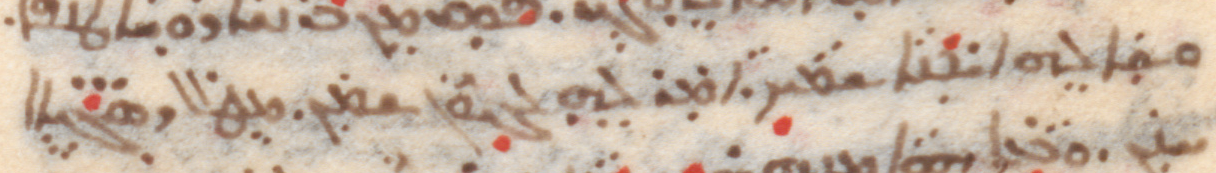ܘܫܐܠܗ ܐܝܟܢܐ ܫܡܟ. ܐܡ̇ܪ ܠܗ ܠܓܝܘܢ ܫܡܢ. ܡܛܠ ܕܣ̈ܓܝܐܐ
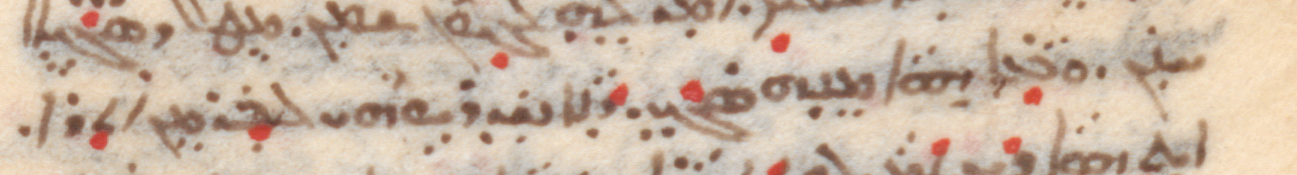ܚܢܢ. ܘܒ̇ܥܐ ܗܘܐ ܡܢܗ ܘܣ̇ܓܝ. ܕܠܐ ܢܫܕܪܝܘܗܝ ܠܒܪ ܡܢ ܐܬܪܐ.
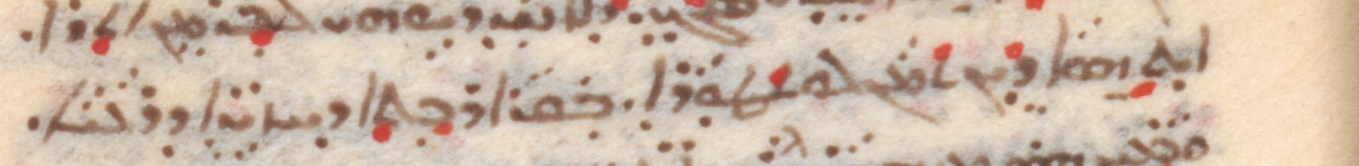ܐܝܬ ܗܘܐ ܕܝܢ ܬܡܢ ܠܘ ܚܛܘܪܐ. ܒܩܪܐ ܪܒܬܐ ܕܚܙܝܪ̈ܐ ܕܪܥܝܐ.
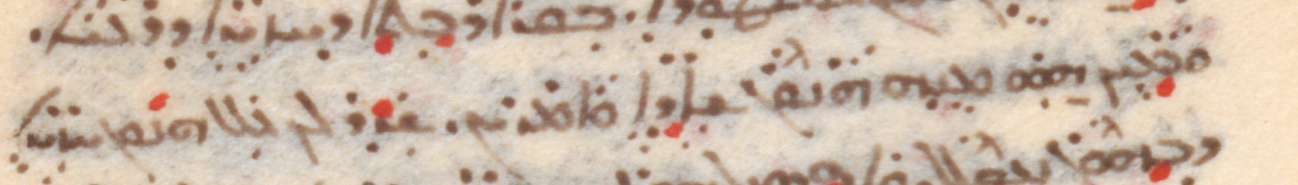ܘܒ̇ܥܝܢ ܗܘܘ ܡܢܗ ܗܢܘܢ ܫܐ̈ܕܐ ܘܐܡ̇ܪܝܢ. ܫܕܪ ܠܢ ܥܠ ܗܢܘܢ ܚܙܝܪ̈ܐ
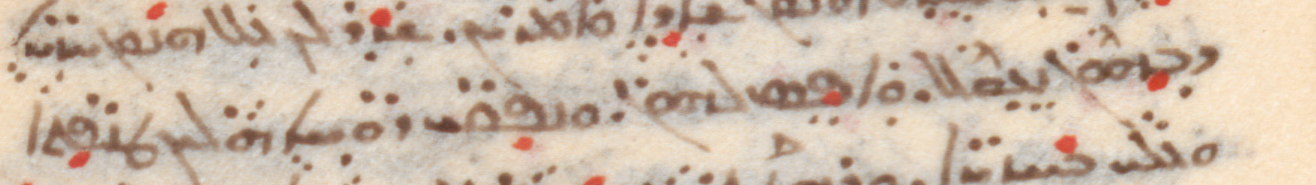ܕܒܗܘܢ ܢܥܘܠ. ܘܐܦܣ ܠܗܘܢ܆ ܘܢܦܩ̈ܝ ܪ̈ܘܚܐ ܗܠܝܢ ܛܢ̈ܦܬܐ
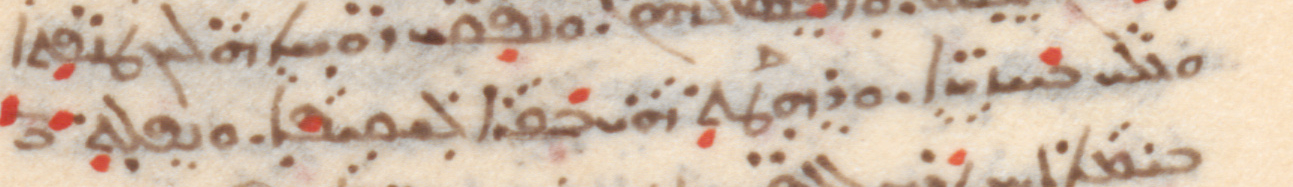ܘܥܠܝ ܒܚܙܝܪ̈ܐ. ܘܪܗܛܬ ܗ̇ܝ ܒܩܪܐ ܠܫܩܝܦܐ. ܘܢܦܠܬ ܏ܒ
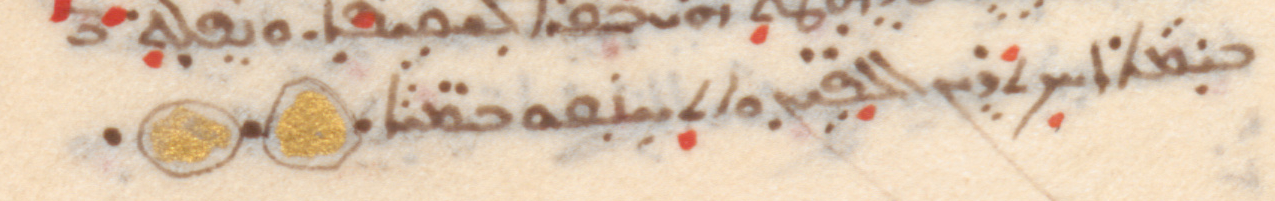ܒܝܡܐ ܐܝܟ ܬܪܝܢ ܐܠܦܝ̈ܢ. ܘܐܬܚܢܩܘ ܒܡ̈ܝܐ ܀ ܀
